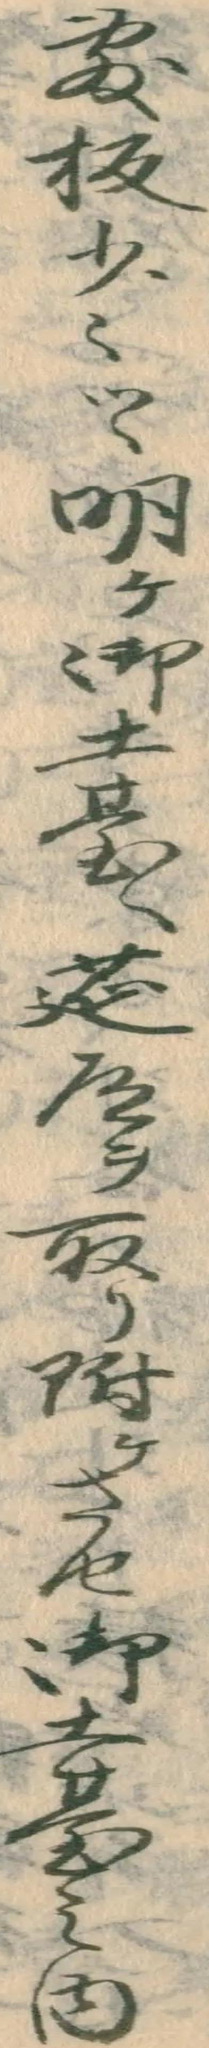敷板少々ツヽ明ケ御土台へ筵道ヲ取リ附ケさセ御土台之内
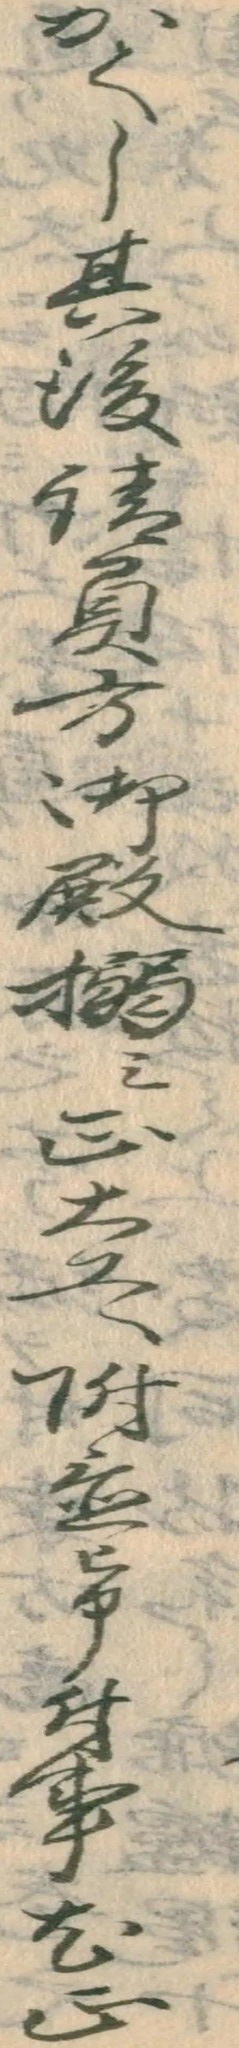かくし其後請負方御殿搦ミ正大工へ附置被申付事尤正
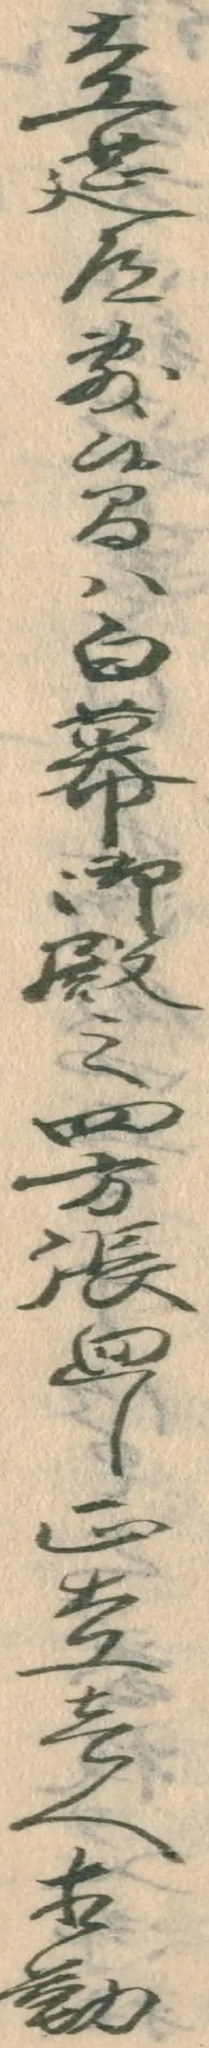大工筵道敷候間ハ白幕御殿之四方張廻し正大工壱人相勤
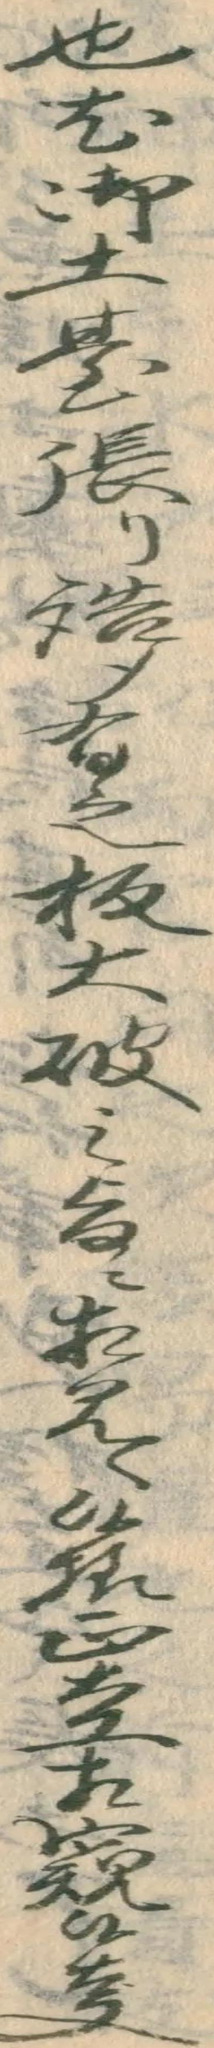也尤御土台張リ詰メ有之板大破之旨ニ相見へ候様正大工相窺候事
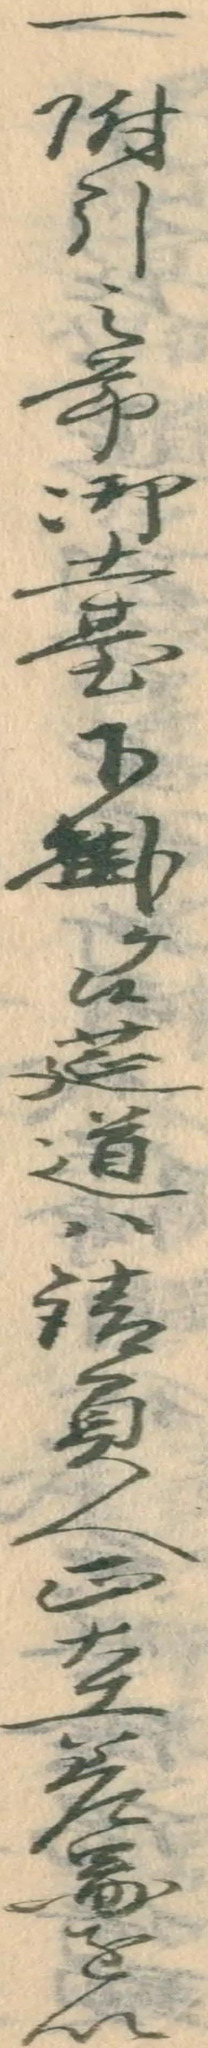一附引之節御土台下掛ケ候莚道ハ請負人正大工差図を以
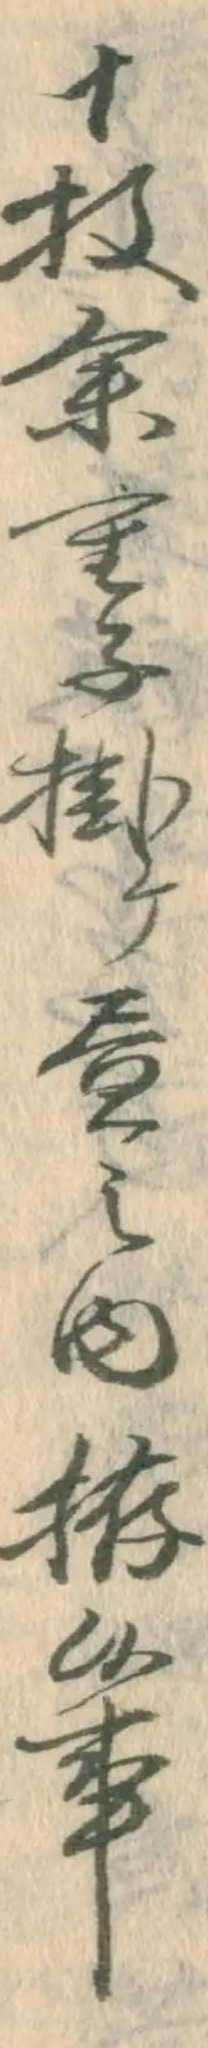十枚余重子掛ヶ昼之内拵候事
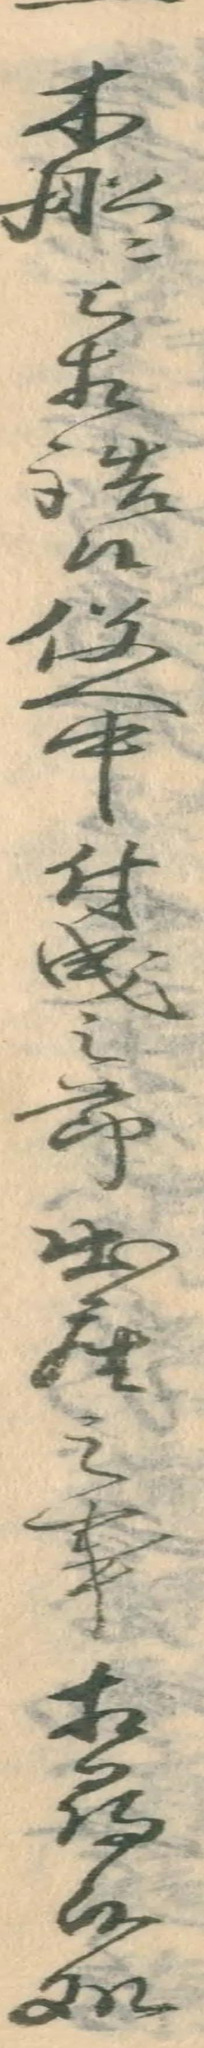一木船ニ被相詰候役人中付曳之節出座之事相尋候処

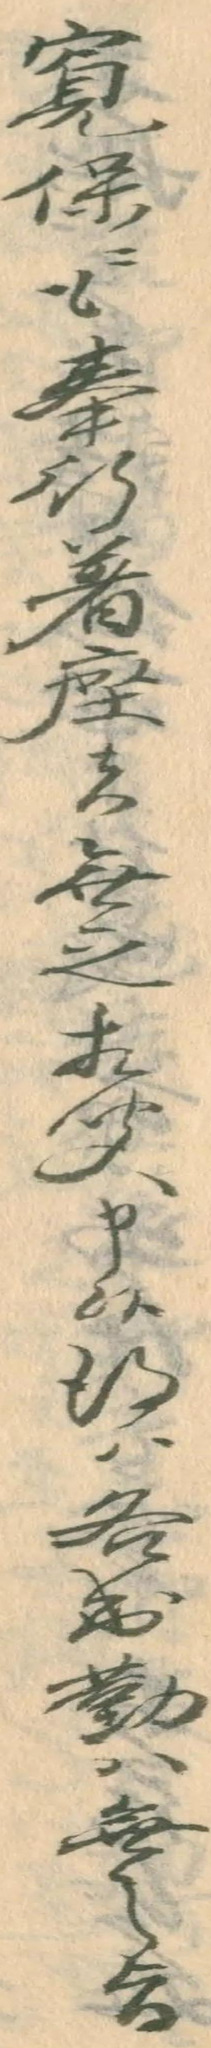寛保ニも奉行着座者無之相聞申候得ハ各出勤ハ無之旨
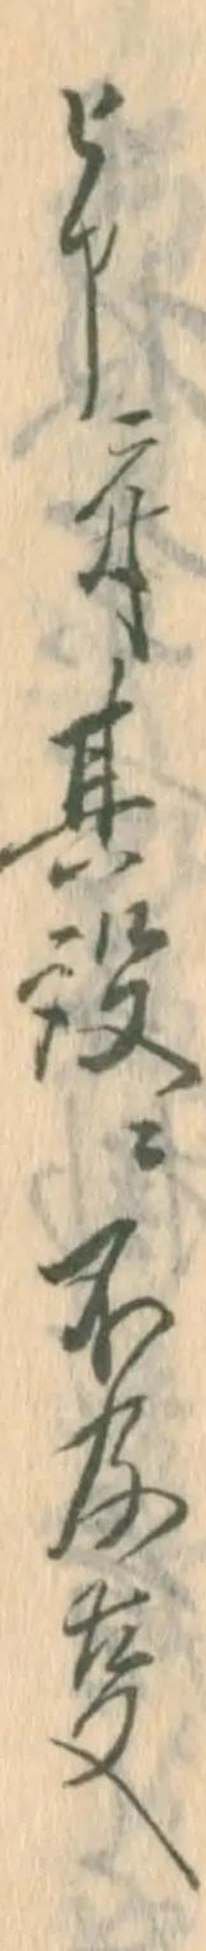被申ニ付其設ニ不及事
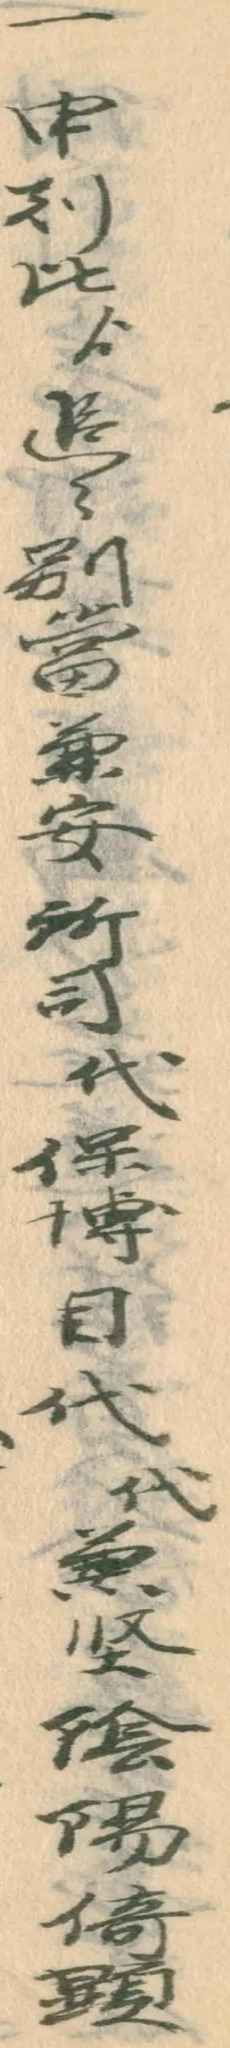一申刻比ゟ追々別当兼安所司代保博目代代兼堅陰陽倚顕
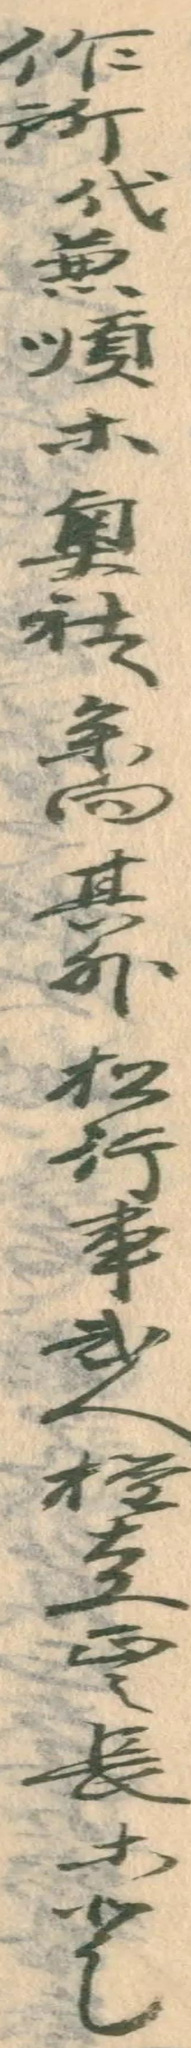作所代兼順等奥社へ参向其外松行事弐人権大工正之長等少し
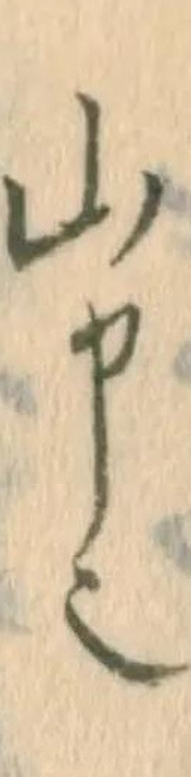山申也
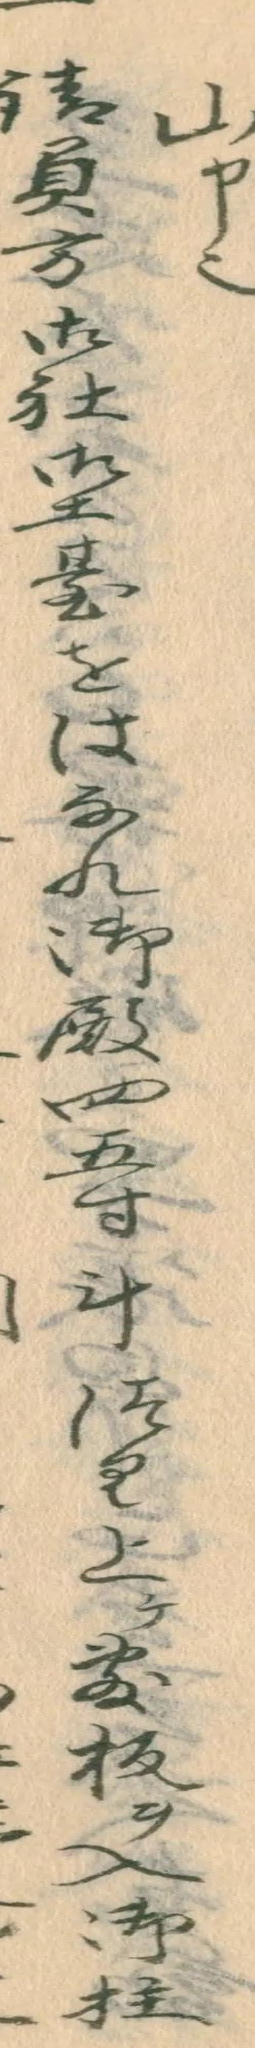一請負方御社御土台をはなれ御殿四五寸計つり上ヶ敷板ヲ入御柱
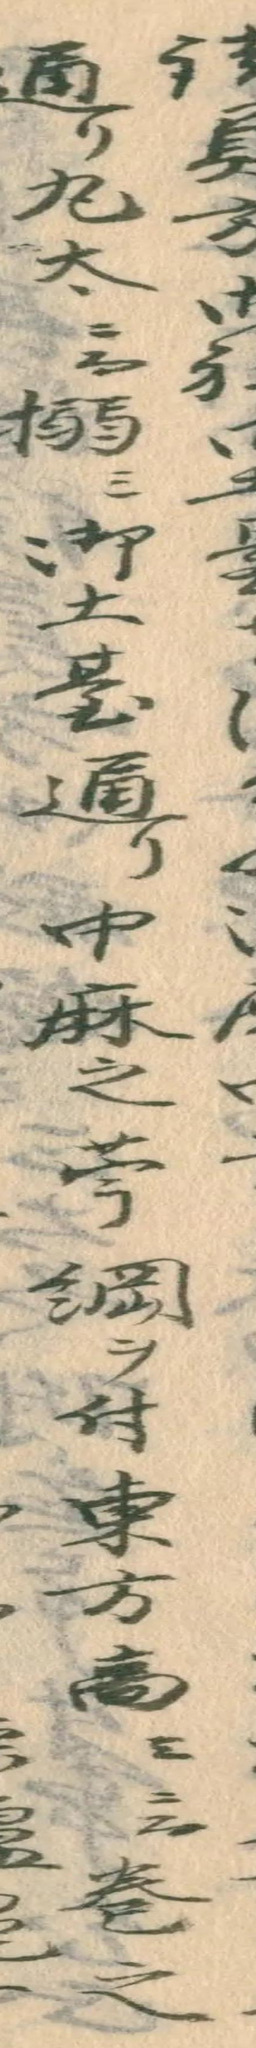通リ丸太ニ而搦ミ御土台通リ中麻之苧綱ヲ付東方高みニ而巻之
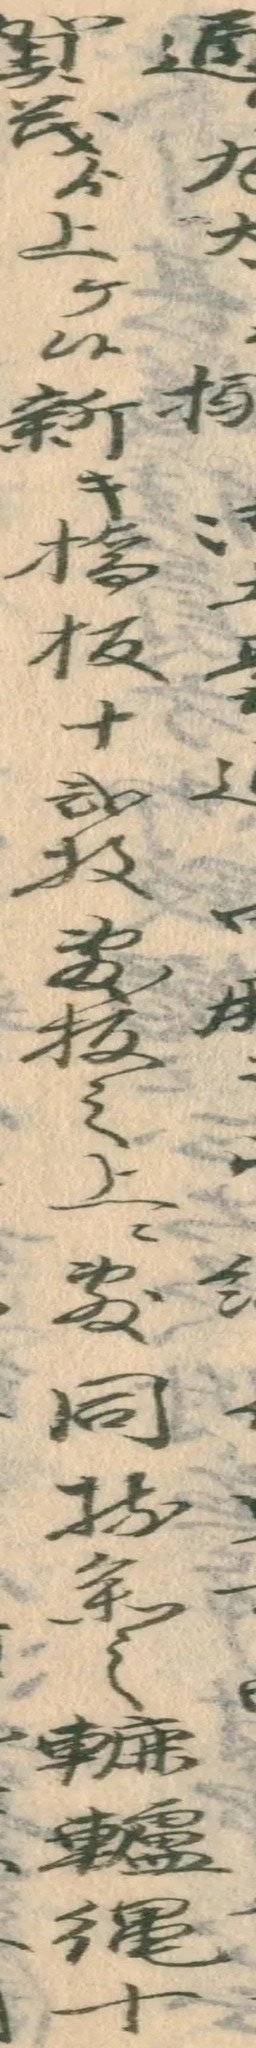賀茂ゟ上ケ候新キ橋板十弐枚敷板之上ニ敷同持参之轆轤縄十
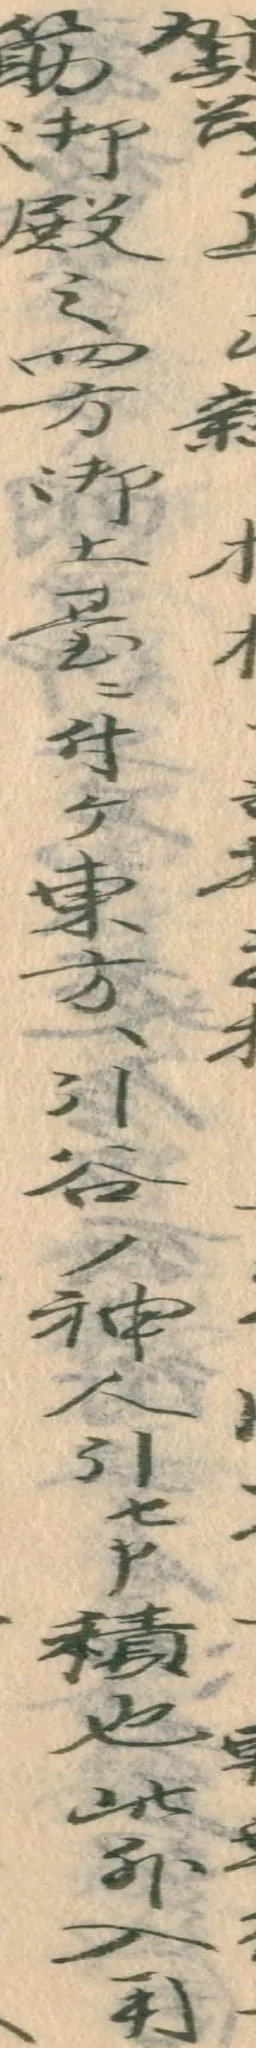筋御殿之四方御土台ニ付ケ東方へ引谷ノ神人引セ申積也此外入用
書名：賀茂社記録. 第17冊
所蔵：国立国会図書館 National Diet Library, JAPAN
